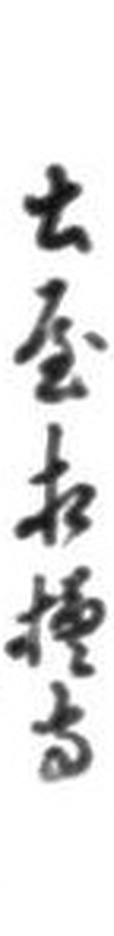土屋相模守
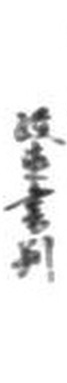政直書判
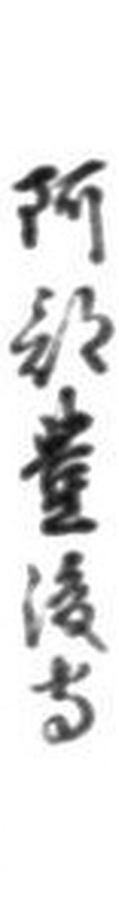阿部豊後守
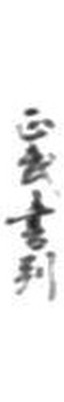正武書判
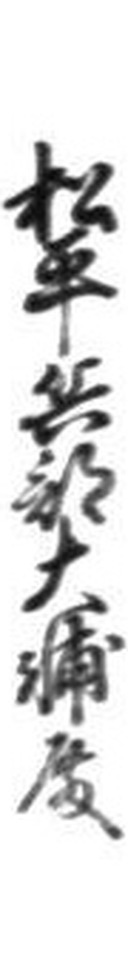松平兵部大輔殿

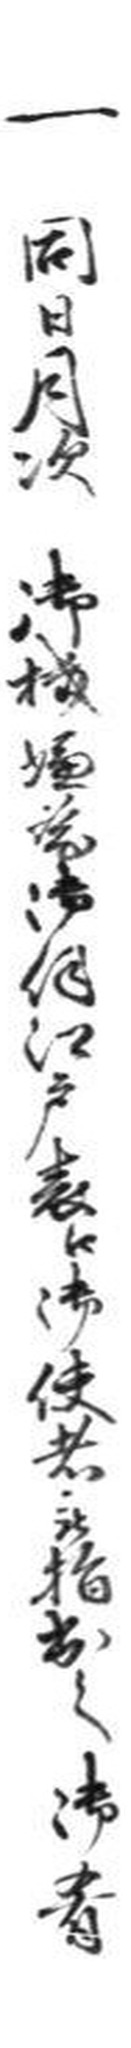一同日月次御機嫌為御伺江戸表江御使者被指出之御肴
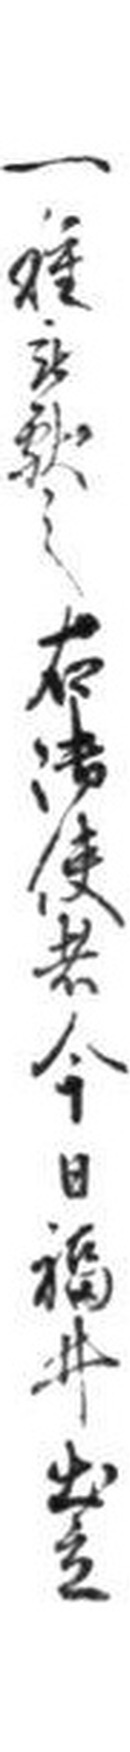一種被献之右御使者今日福井出立
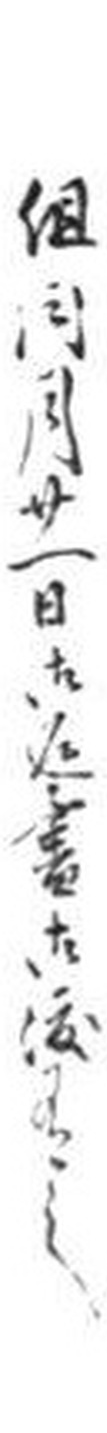但同月廿一日御返書御渡有之
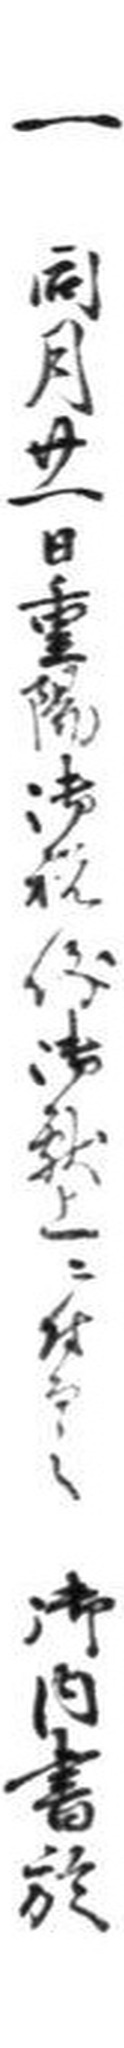一同月廿一日重陽御祝儀御献上ニ付而之御内書於
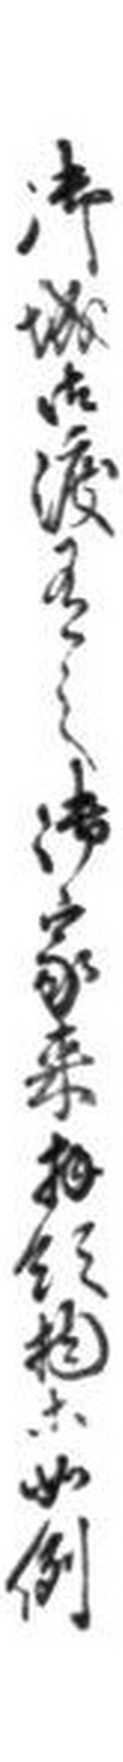御城御渡有之御家来拝領物等如例
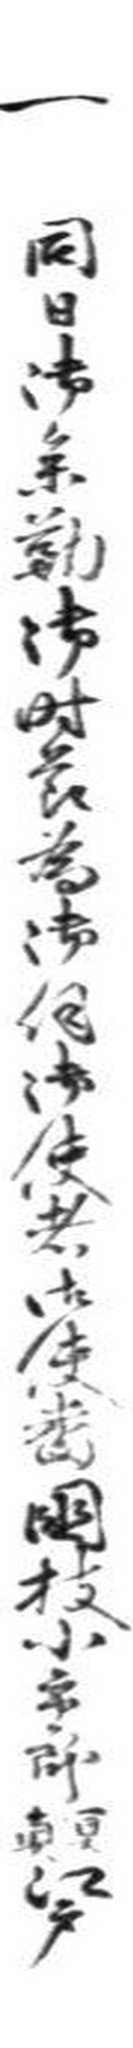一同日御参勤御時節為御伺御使者御使番国枝小市郎冥真江戸
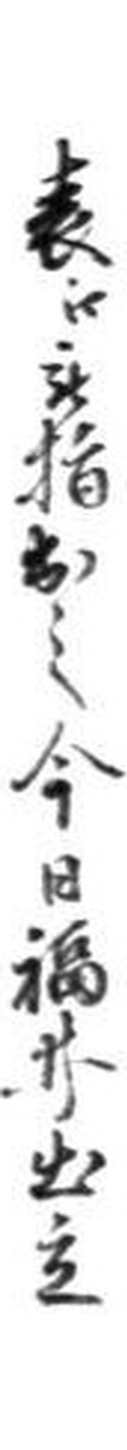表江被指出之今日福井出立
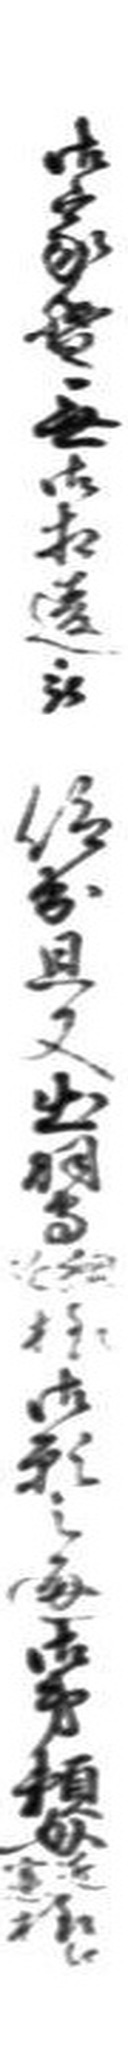御家督無御相違被仰出且又出羽守綱近様御願之通御弟頼母近憲様江
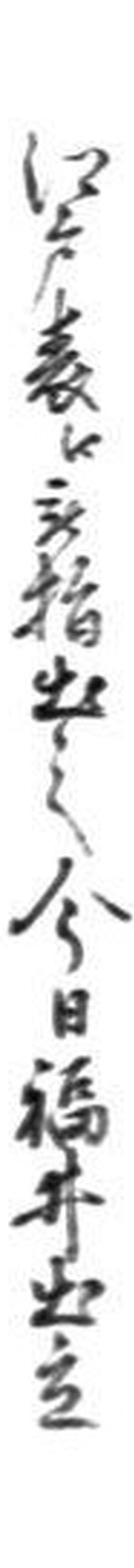江戸表江被指出之今日福井出立
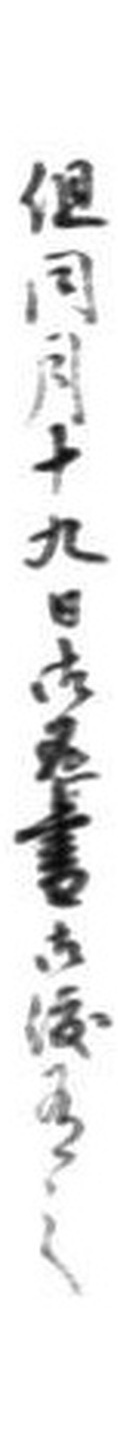但同月十九日御返書御渡有之
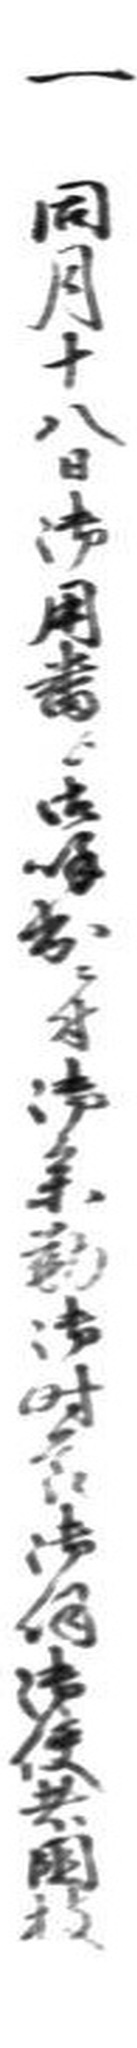一同月十八日御用番ゟ御呼出ニ付御参勤御時節御伺尾御使者国枝
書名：家譜 二十一 吉品公 従元禄十三年到同十四年
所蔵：福井県文書館 Fukui Prefectural Archives
